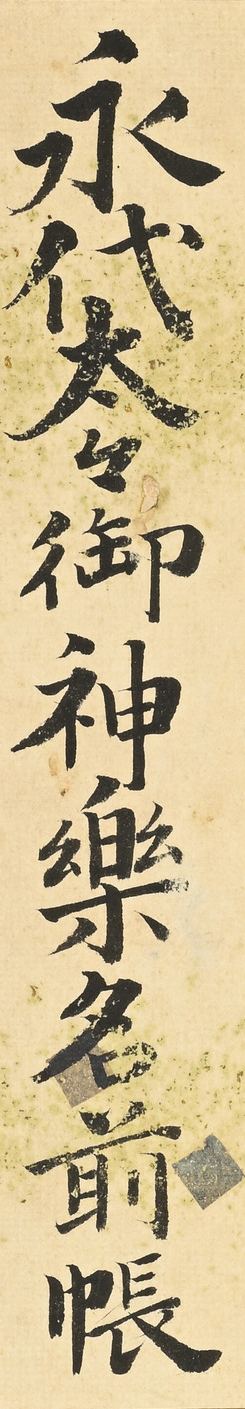永代太々神楽名前帳

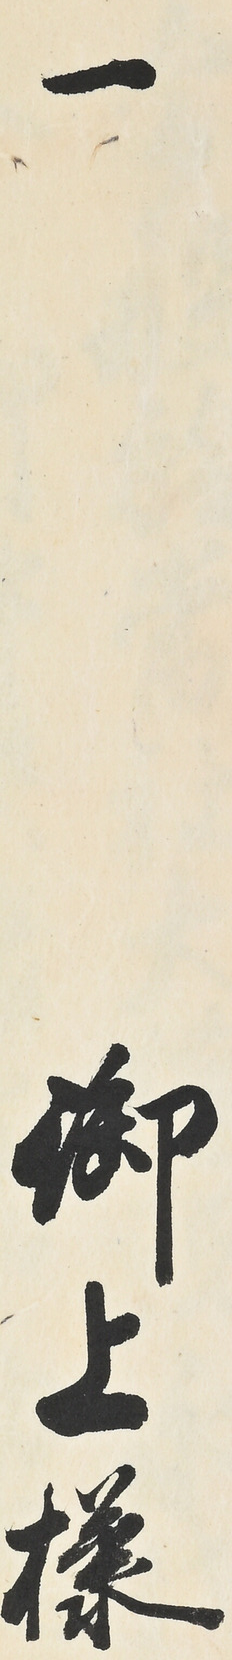一御上様
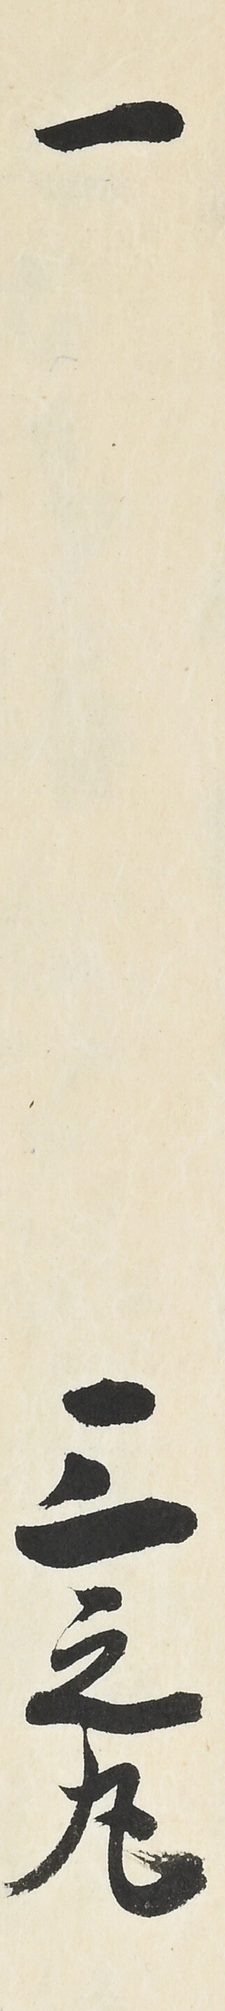一三之丸
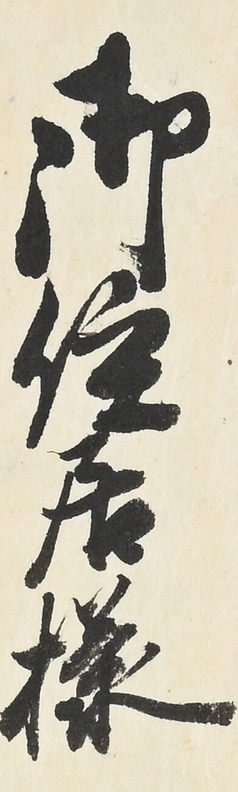御住居様

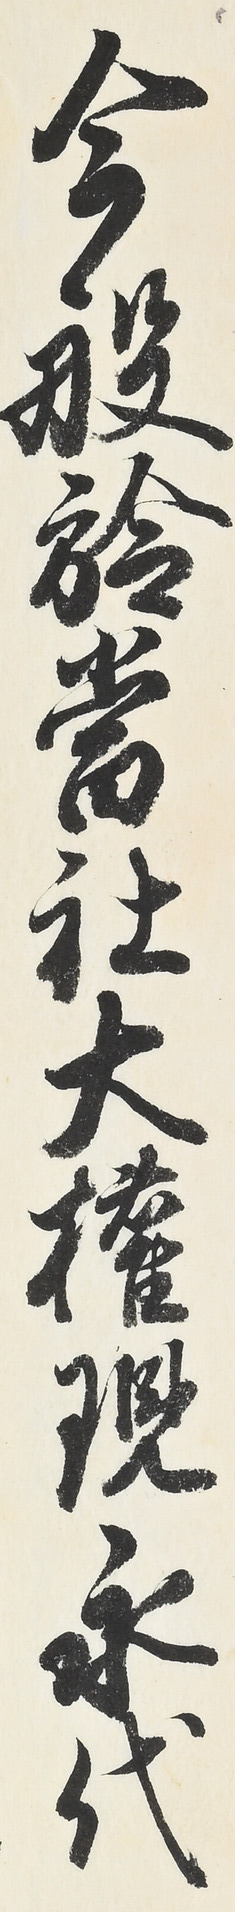今般於当社大権現永代
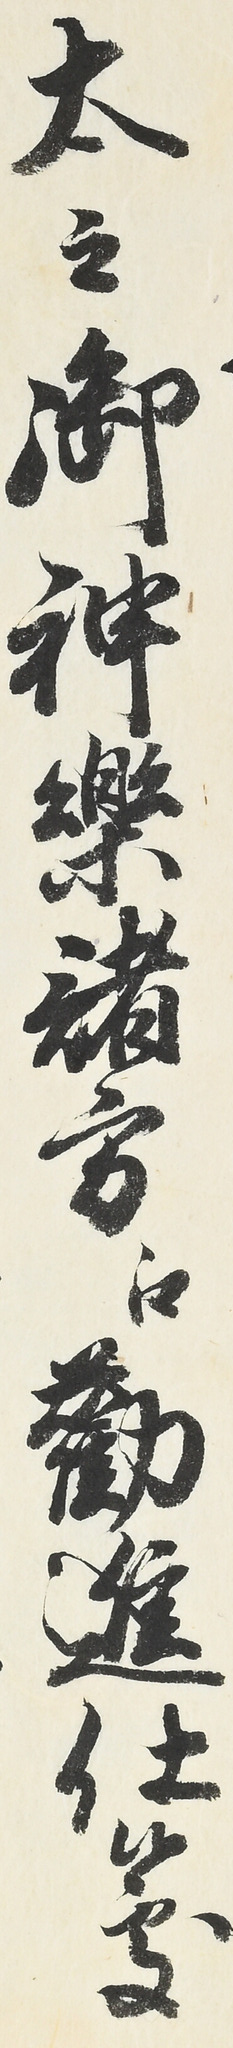太々御神楽諸方江勧進仕候処
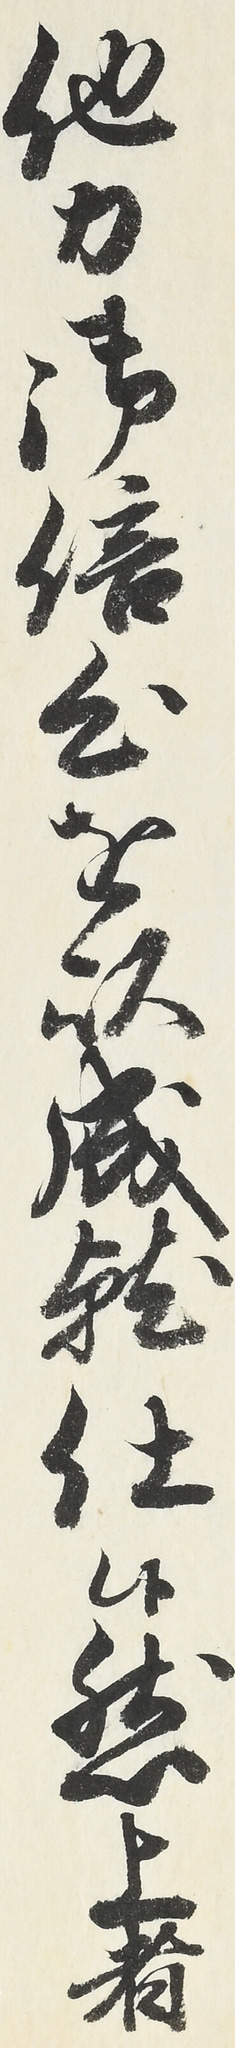他力御信心を以成就仕候然上者
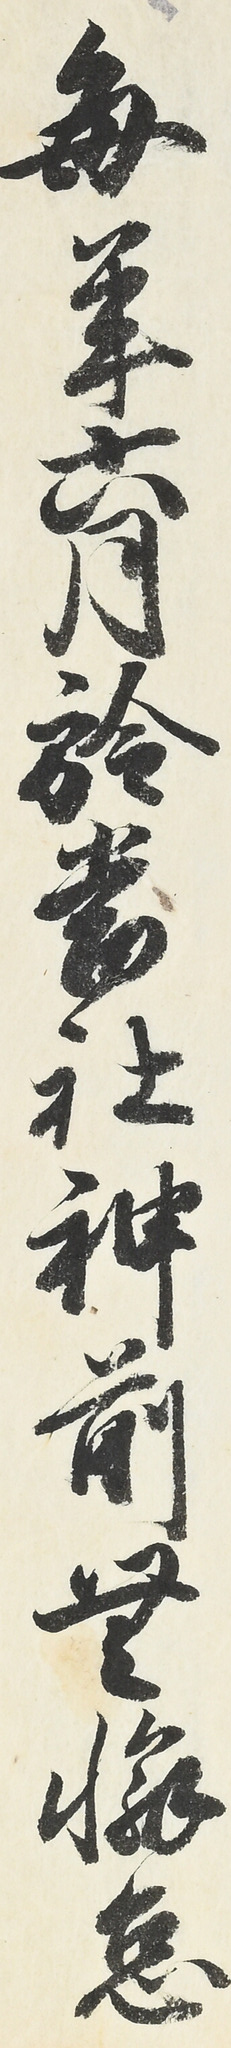毎年六月於当社神前無懈怠
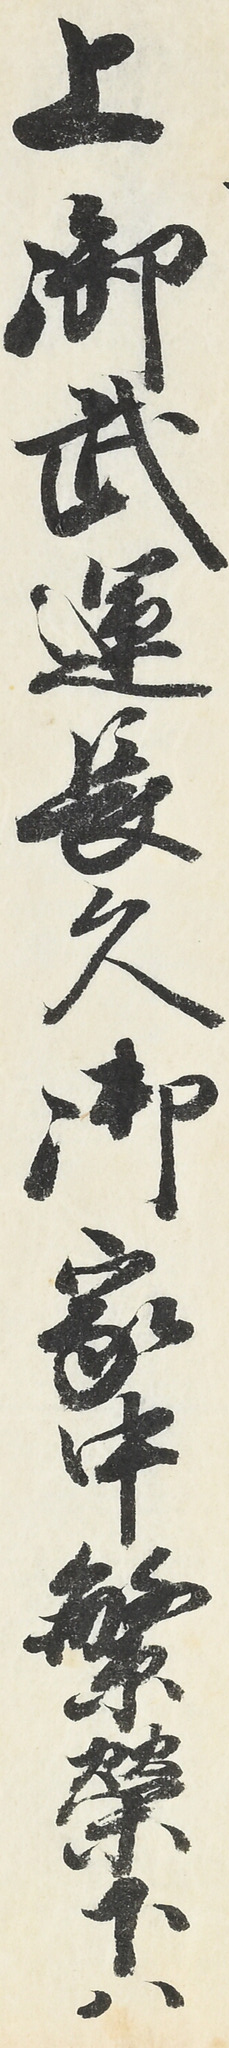上御武運長久御家中繁栄下ハ
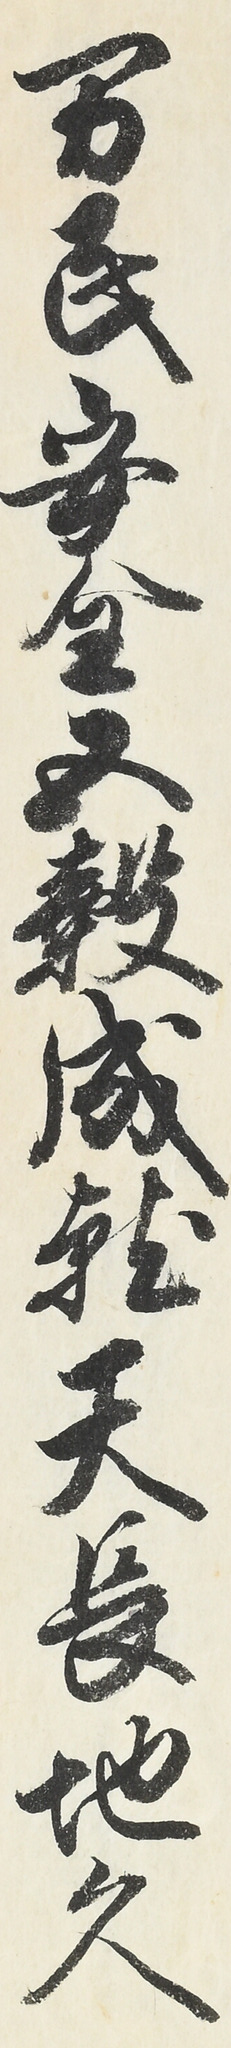万民安全五穀成就天長地久

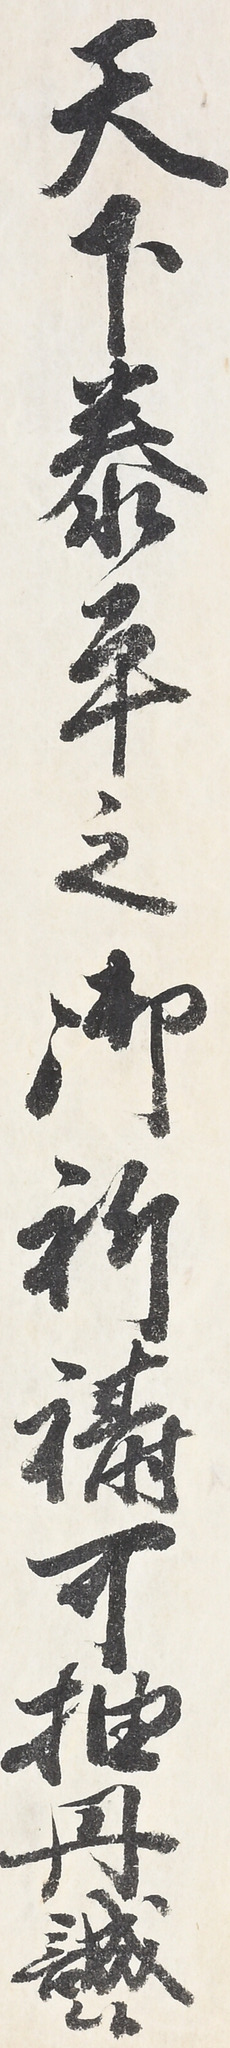天下泰平之御祈祷可抽丹誠候
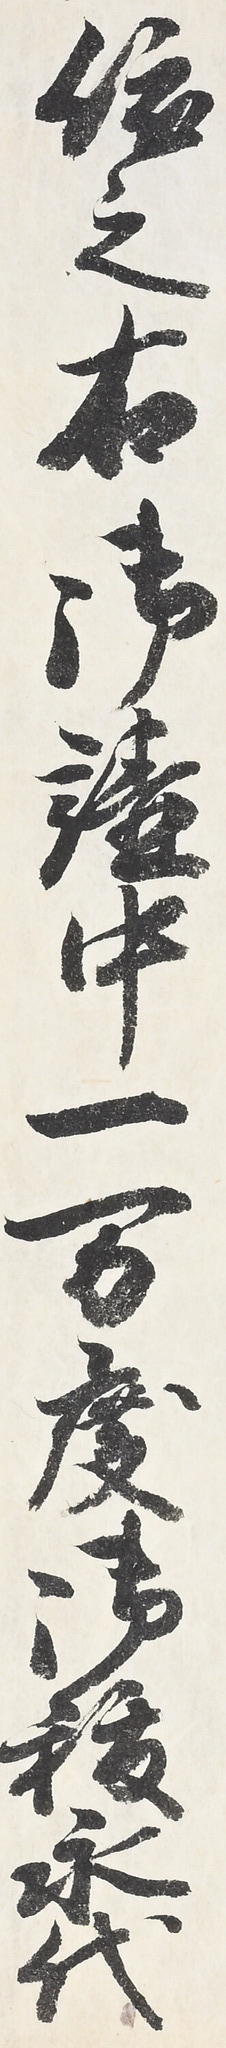依之右御講中一万度御祓永代
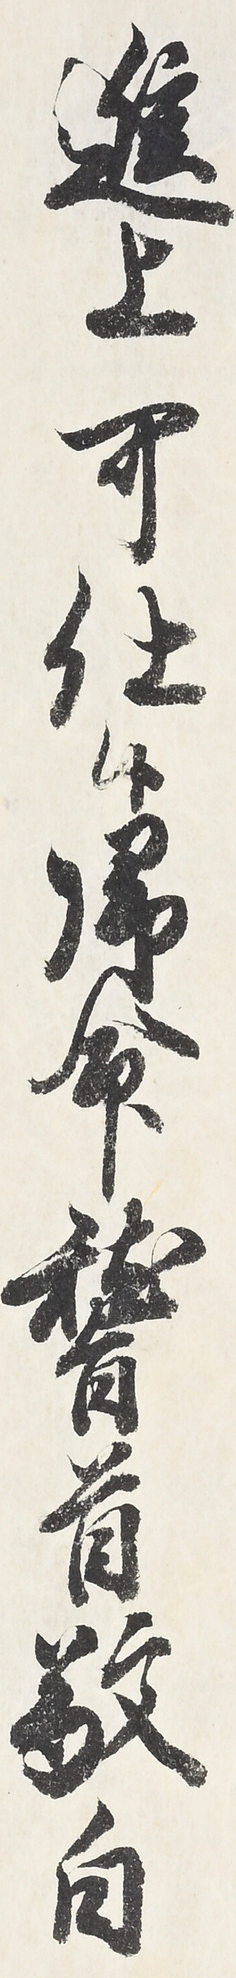進上可仕候帰命稽首敬白
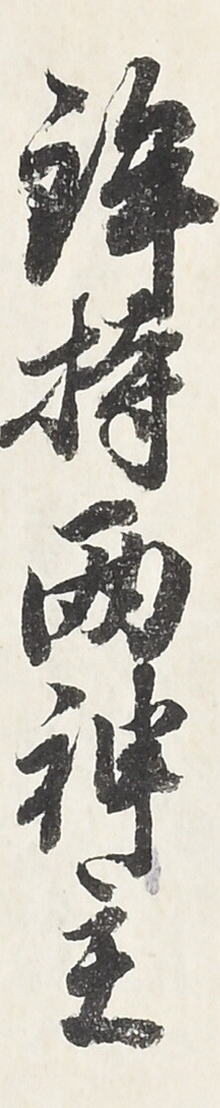鉾持両神主
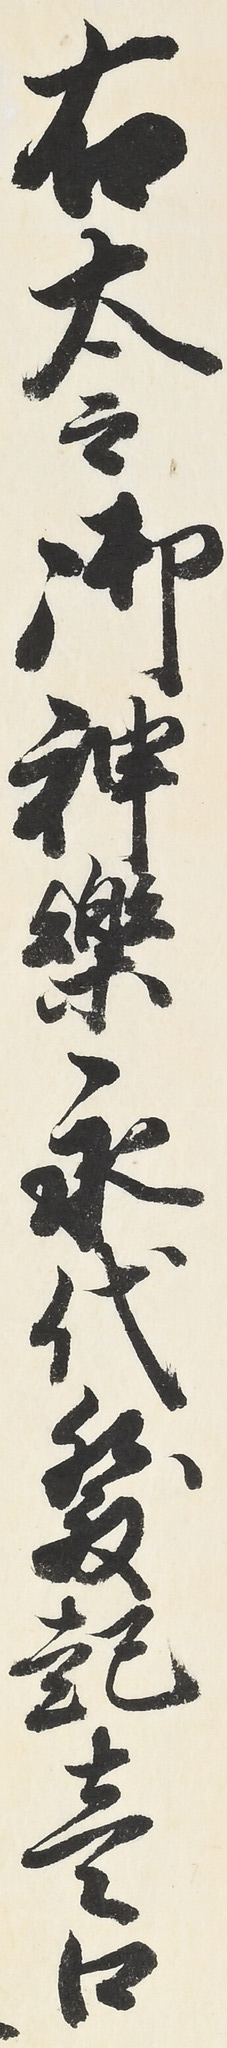右太々御神楽永代発起壱口
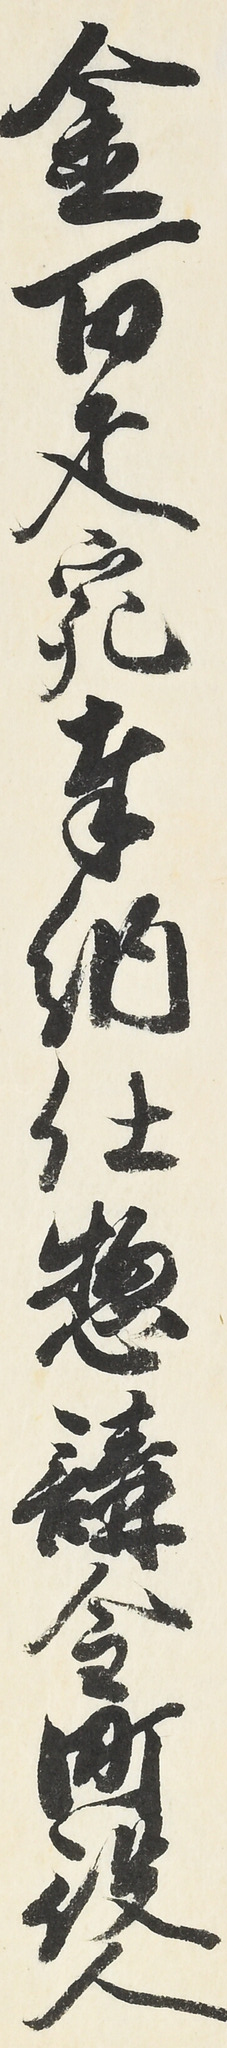金百疋宛奉納し惣講金町役人
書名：永代太々御神楽名前帳
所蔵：伊那市立高遠町図書館・合同会社AMANE
